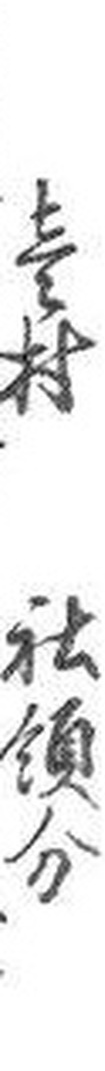三村社領分
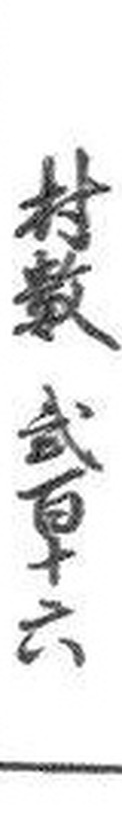村数弐百十六
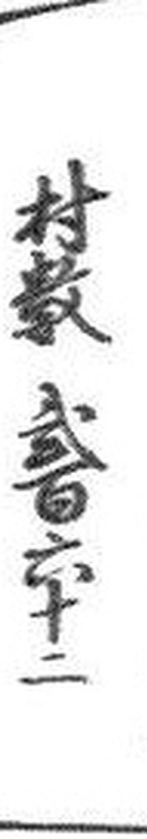村数弐百六十二
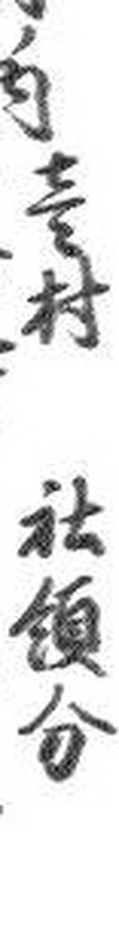三村社領分
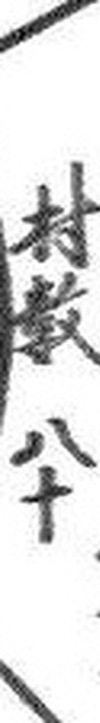村数八十
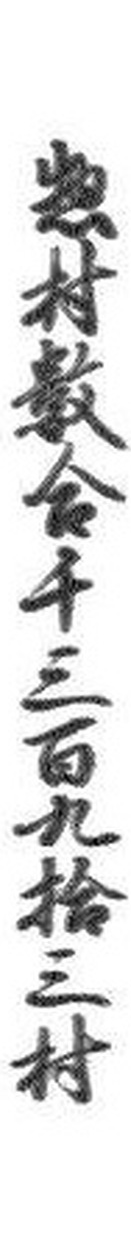惣村数合千三百九拾三村

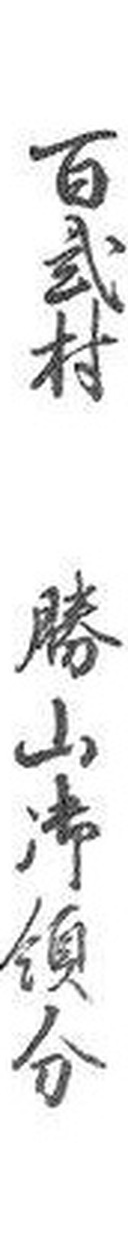百弐村勝山御領分
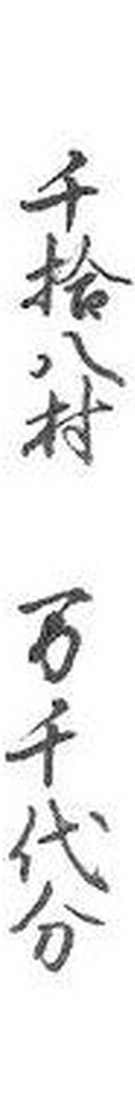千拾八村万千代分
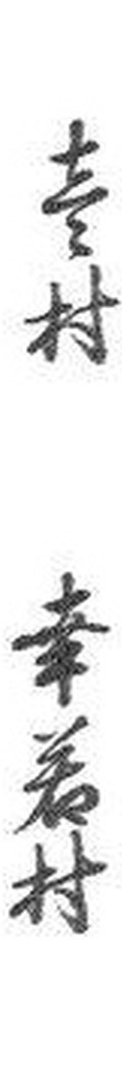壱村幸若村
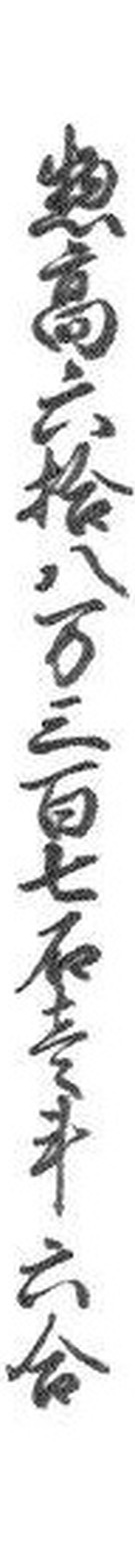惣高六拾八万三百七石壱斗六合
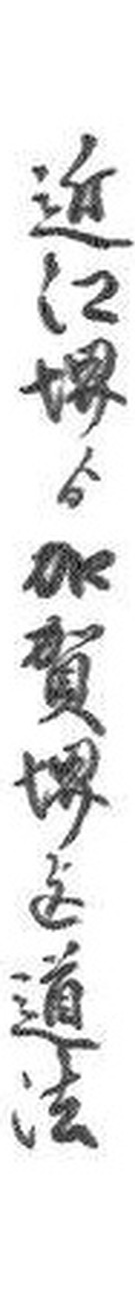近江堺ゟ加賀堺迄道法
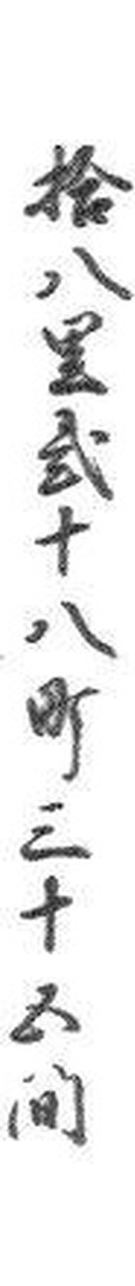拾八里弐十八町三十五間
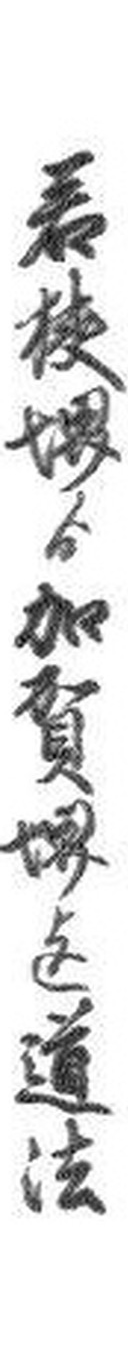若狭堺ゟ加賀堺迄道法
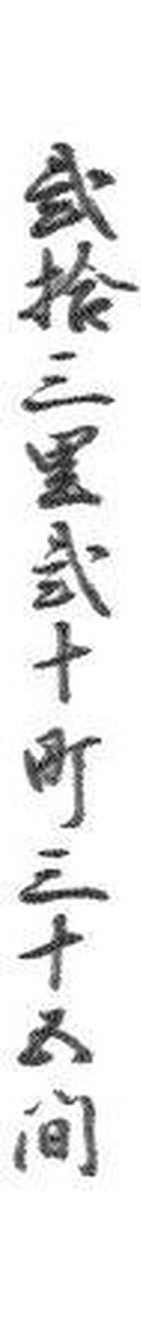弐拾三里弐十町三十五間
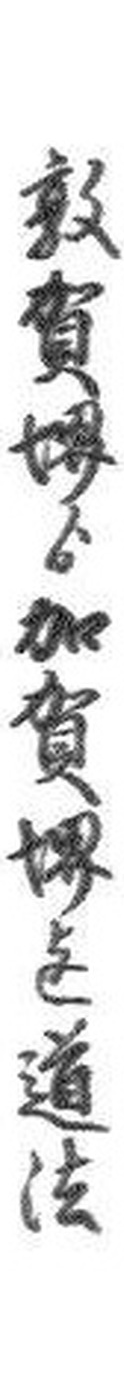敦賀堺ゟ加賀堺迄道法
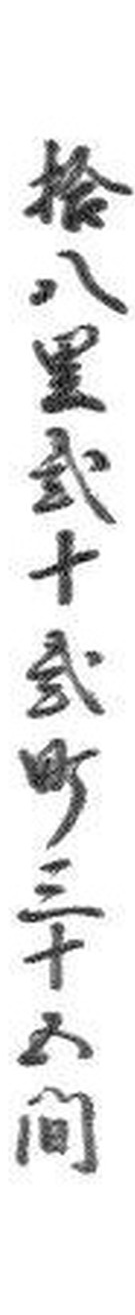拾八里弐十弐町三十五間
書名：家譜 五 光通公 従寛永十三年到万治二年
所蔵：福井県文書館 Fukui Prefectural Archives
